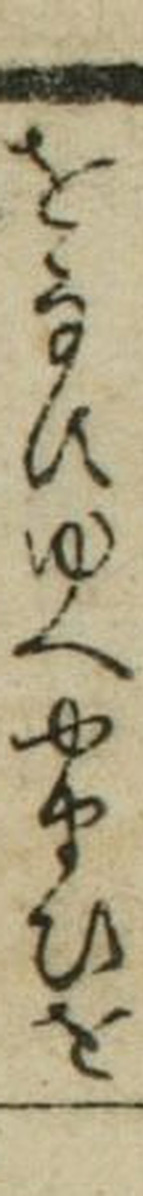をなすゆへやまひを
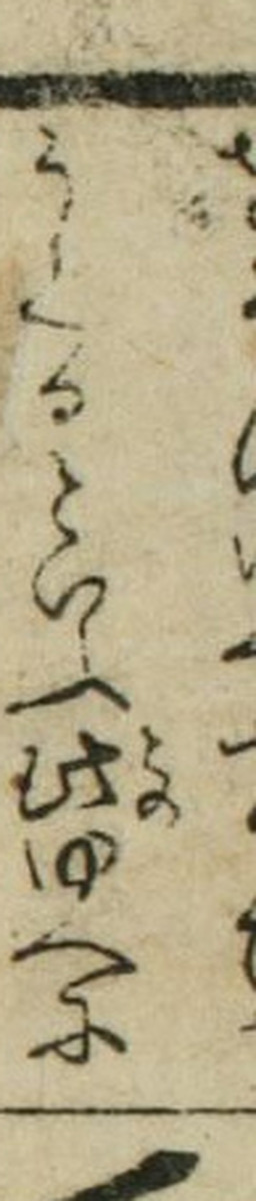うくるといふ此ゆへに
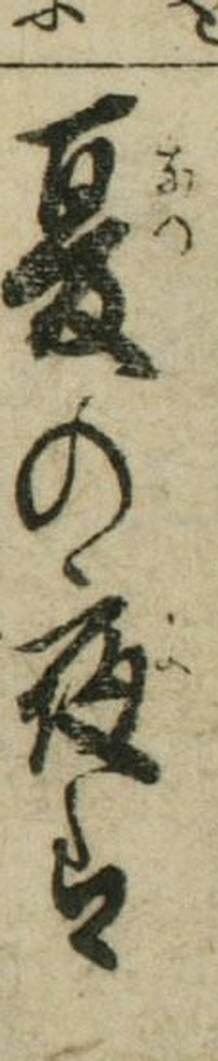夏の夜は
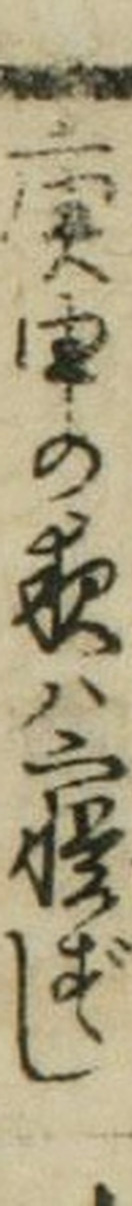庚申の夜は寝ずし
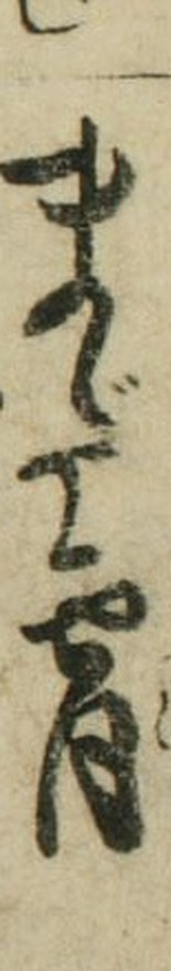まだ宵
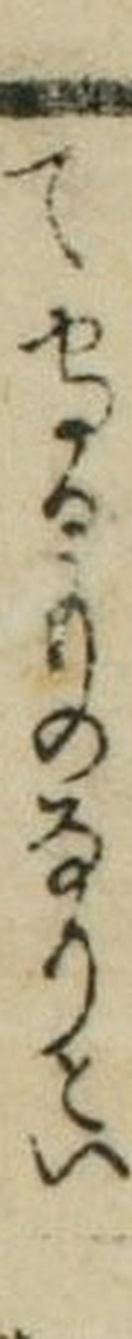て守るものなりとい
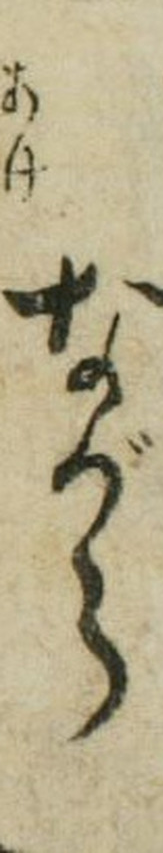ながら
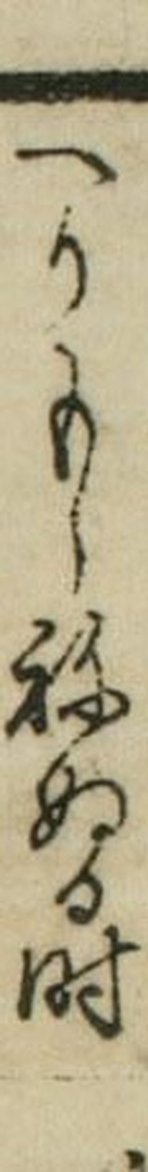へりもしねぬる時
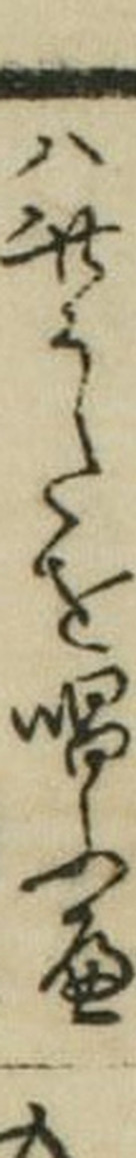は此うたを唱ふべし
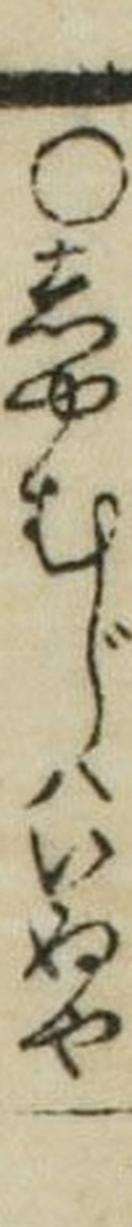○しやむじはいぬや
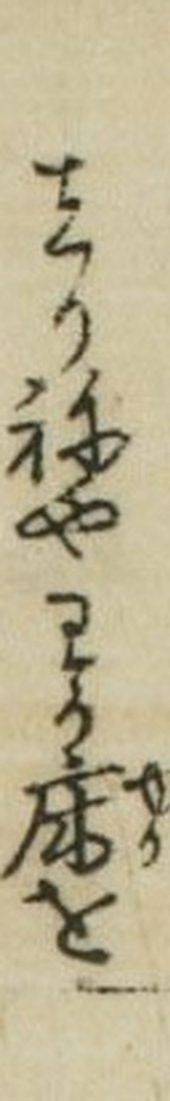去りねやわか床を
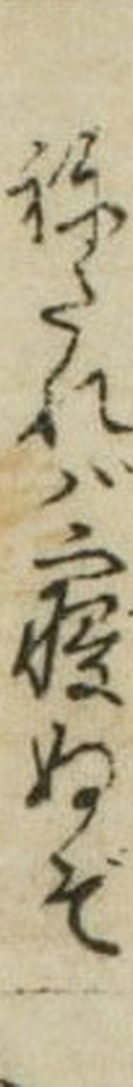ねたれば寝ぬぞ
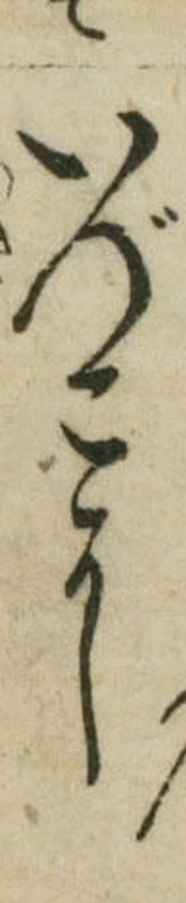いづこに
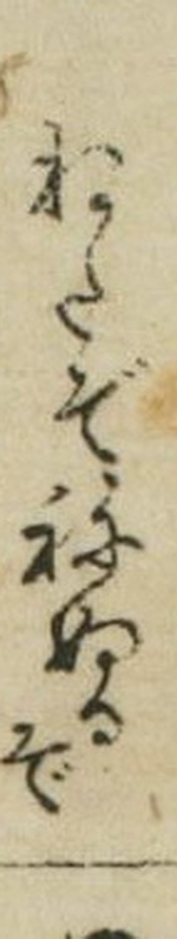ねたぞねぬるぞ
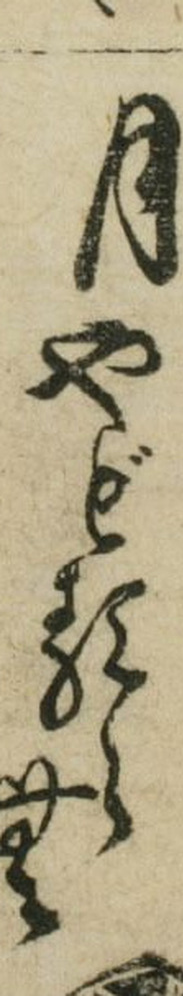月やどるら
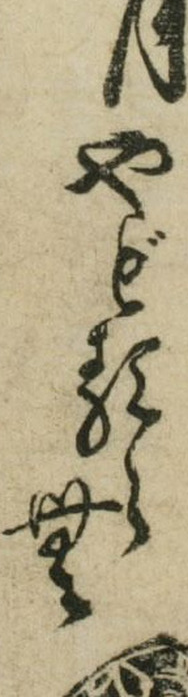月やどるら
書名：百人一首
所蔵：東京学芸大学教育コンテンツアーカイブ
